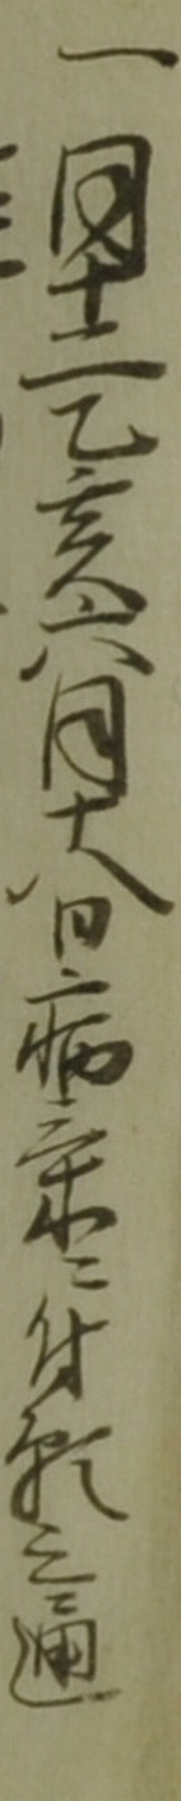一同十二乙亥六月十八日病気ニ付願之通
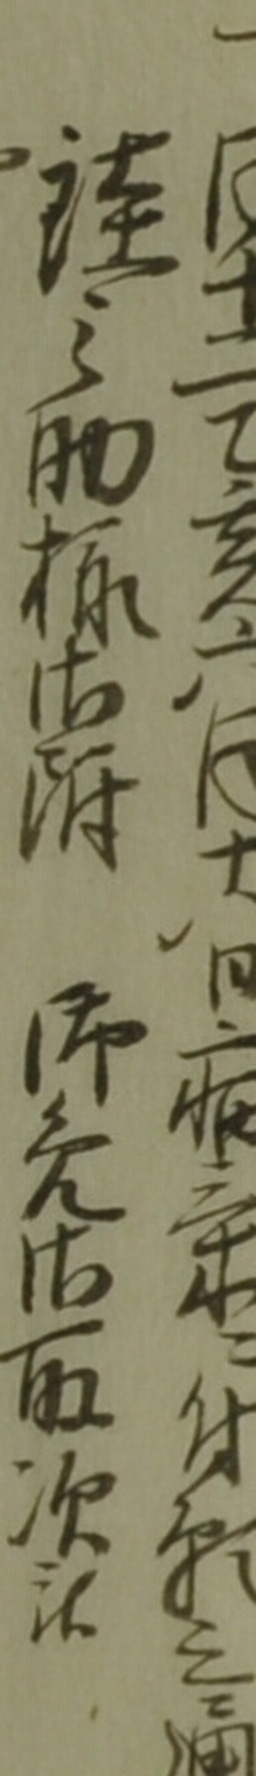銈之助様御附御免御取次被
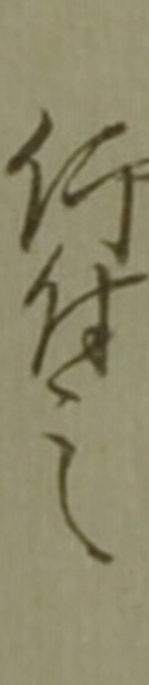仰付之
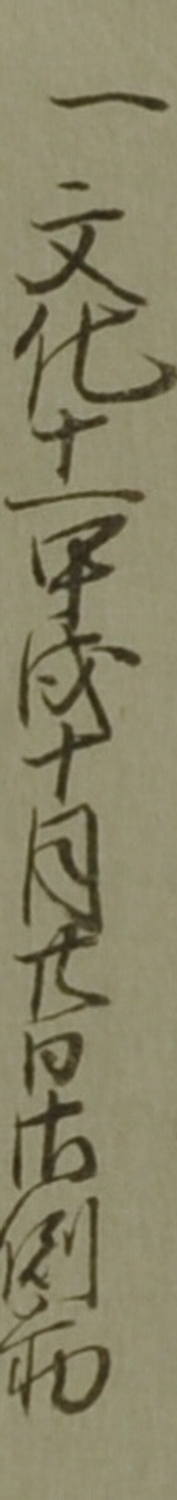一文化十一甲戌十月廿日御側勤
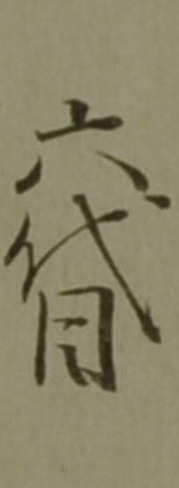六代目
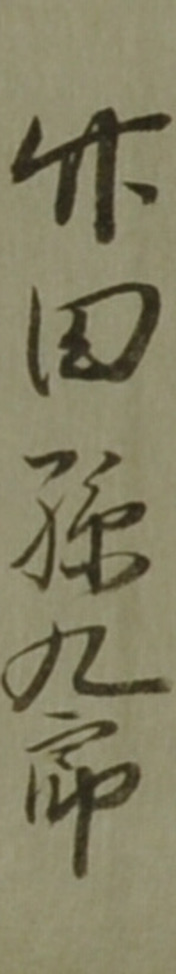竹田孫九郎
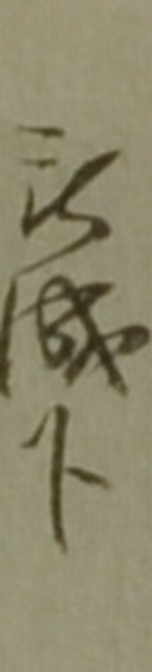被成下
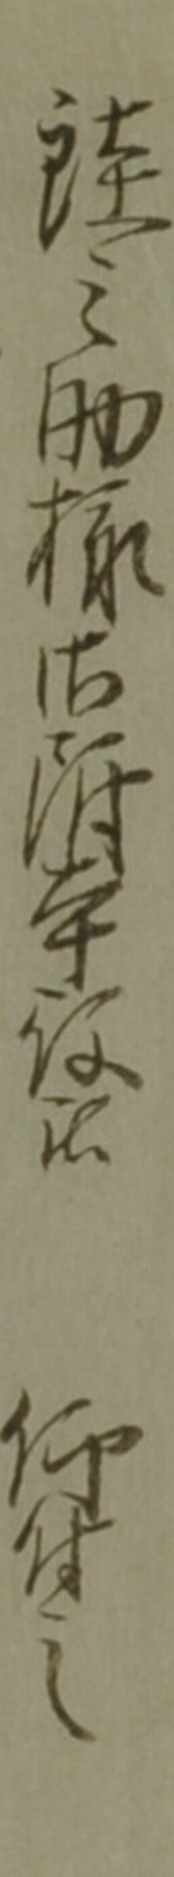銈之助様御附本役被仰付之
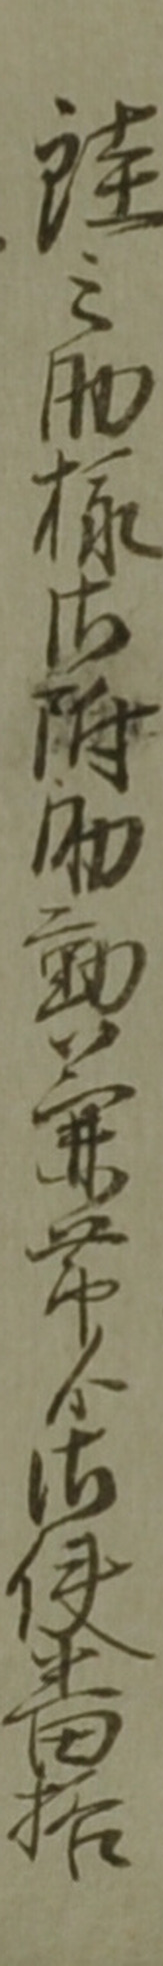銈之助様御附助勤兼帯ゟ御使番格
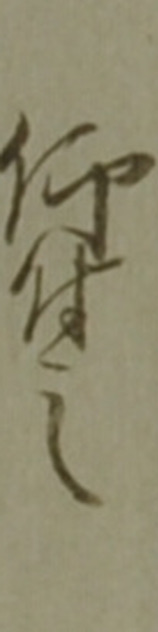仰付之
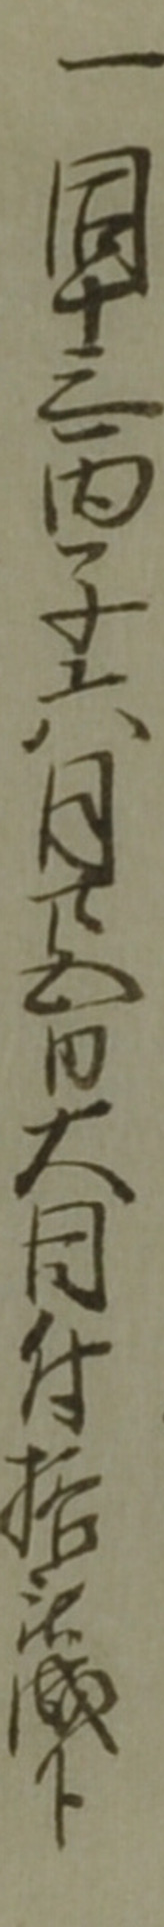一同十三丙子六月廿五日大目付格被成下
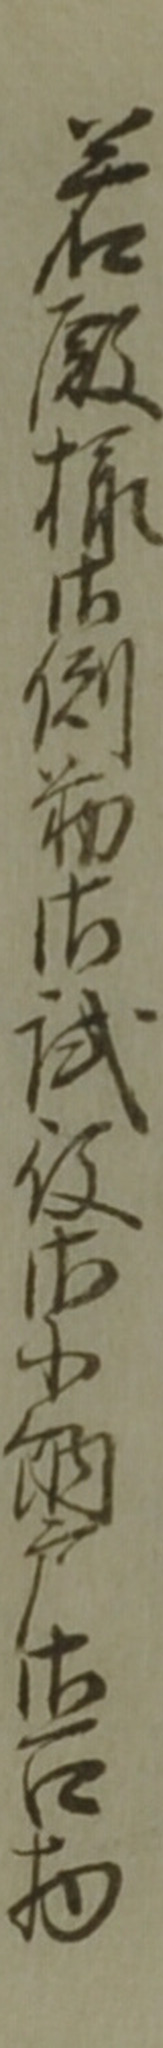若殿様御側勤御試役御小納戸御召物
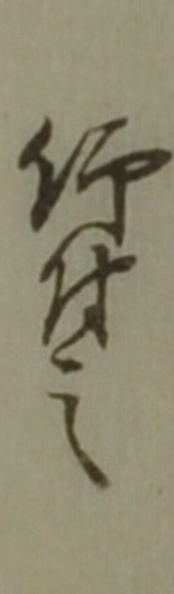仰付之
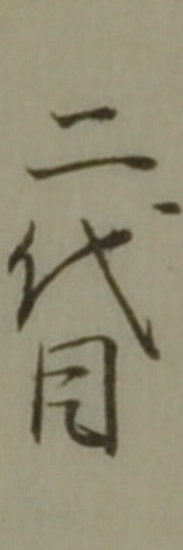二代目
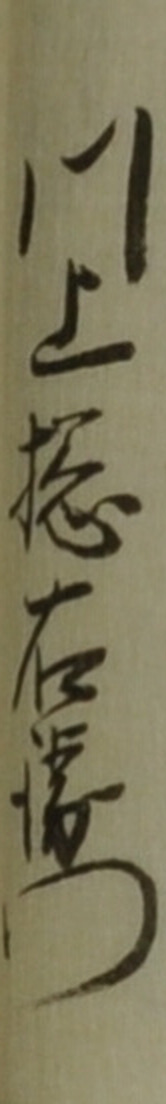川上捴右衛門
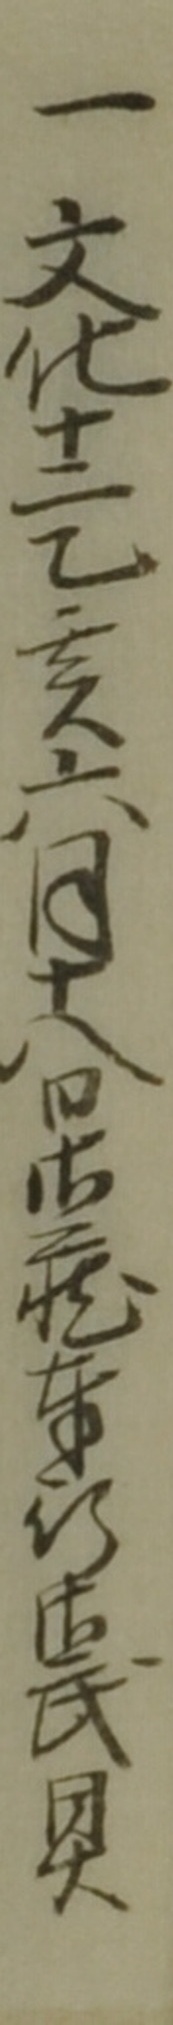一文化十二乙亥六月十八日御蔵奉行御武具
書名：諸御役代々録（六）
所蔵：伊那市立高遠町図書館・合同会社AMANE
